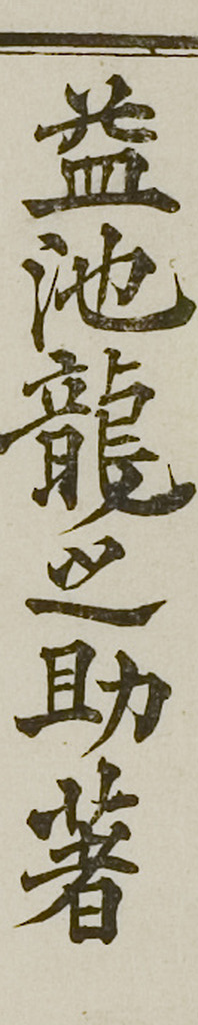益池劉之助著
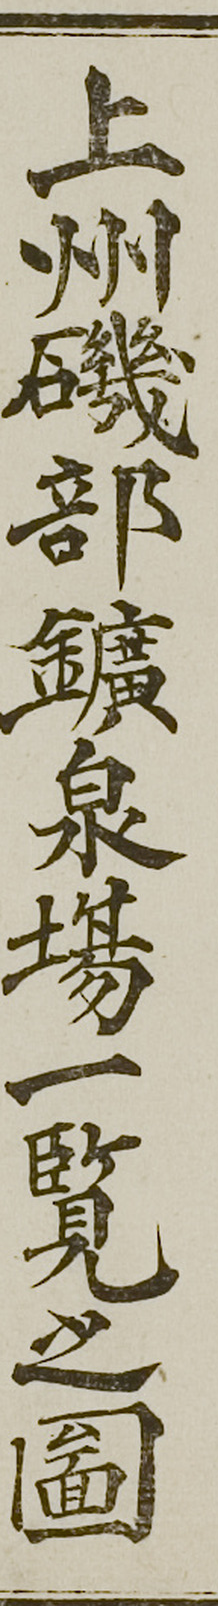上州磯部鉱泉馬一覧之図
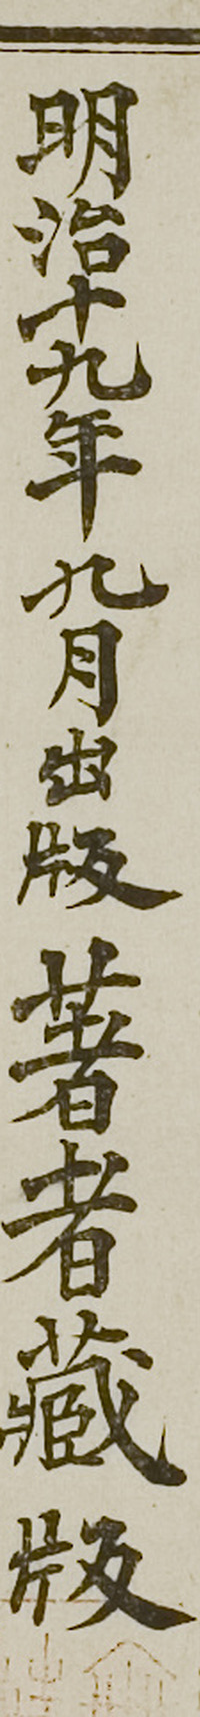明治十九年九月出版著者蔵版(角印)
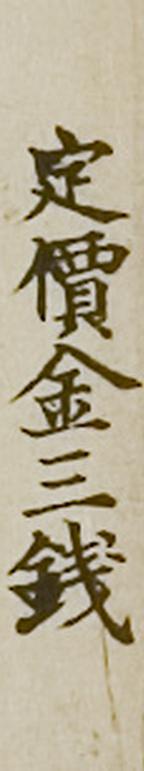定価金三銭
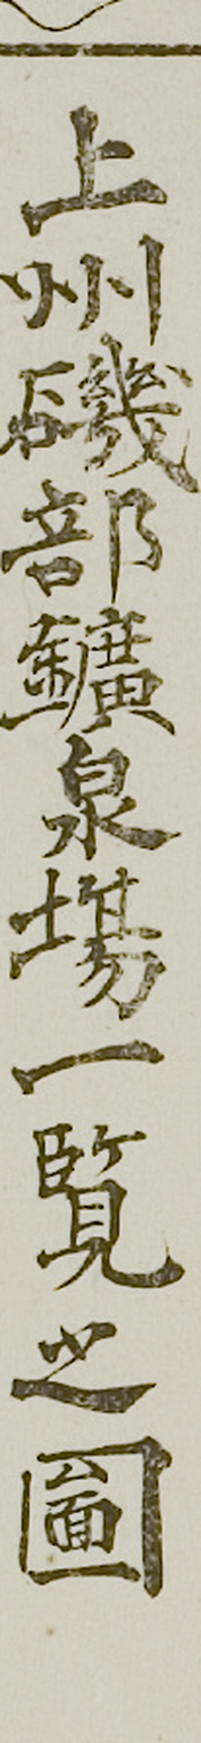上州磯部鉱泉馬一覧之図
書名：上州磯部鉱泉場一覧之図（袋）
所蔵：東京大学総合図書館 General Library in the University of Tokyo, JAPAN
